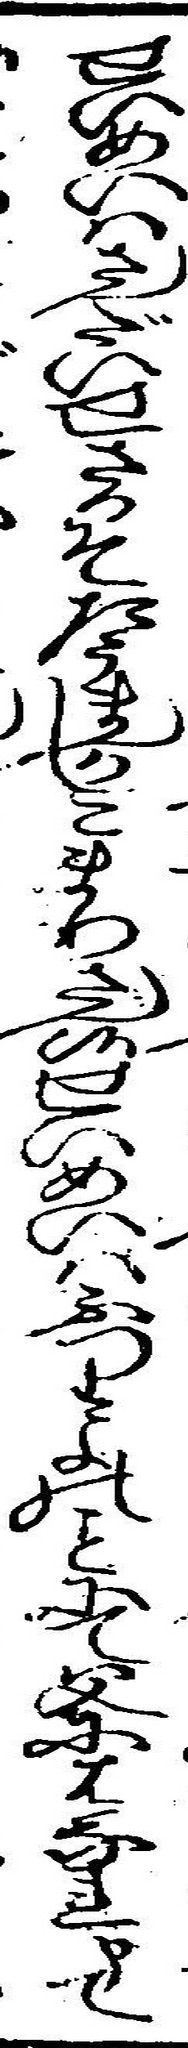せいめいはさんだいせさるそたうまんかしこまりさ也候せいめいはふりよのことにて父にはなれ申て
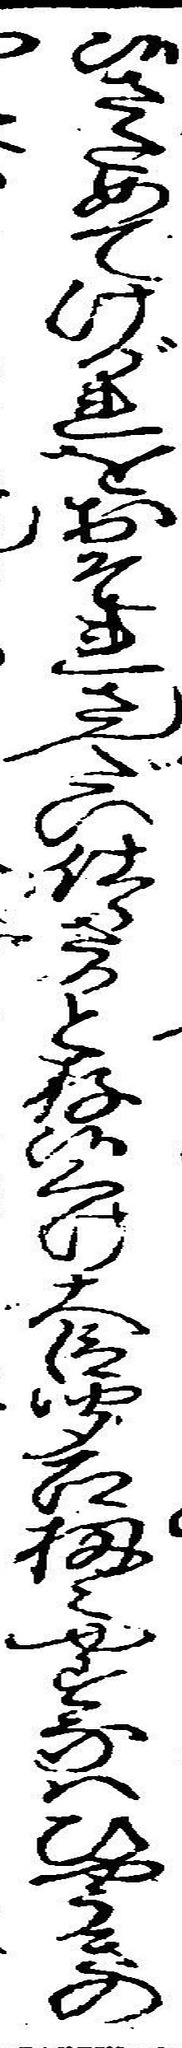候さためてけがれをおそれさんだい仕らさると存候くけ大臣聞召扨々やすなひやうきの
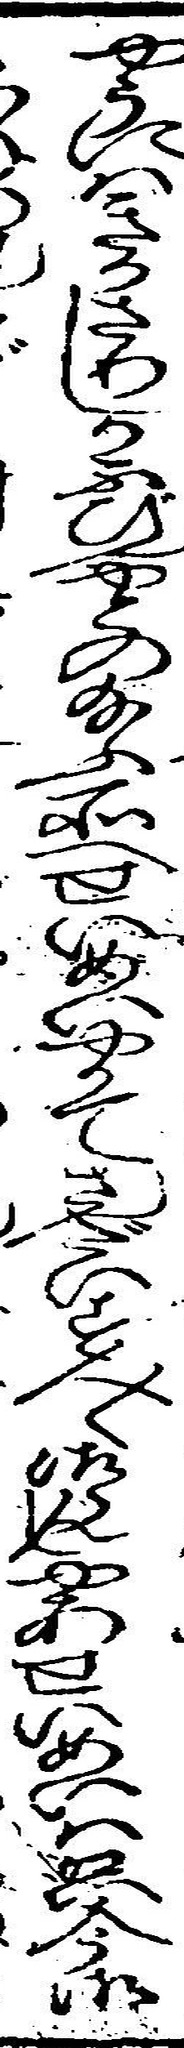やうにはきかさりしかふびんやとの給ふ所へせいめいやかてさんだいす人々御らんしやあせいめいは只今御
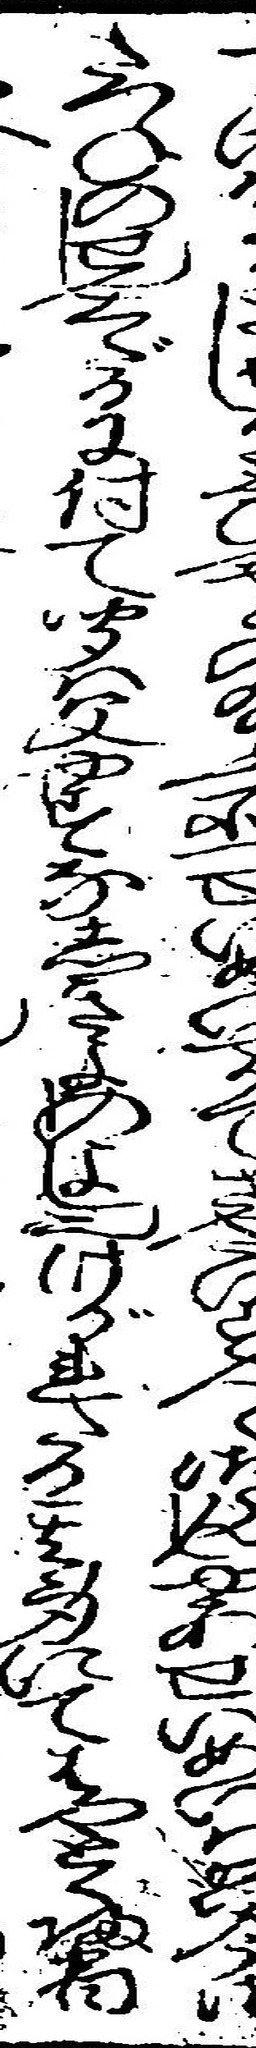たつねのせんしくだるに付て聞は父やすなしきよのよし也けがれたる其身にてはやとく帰省
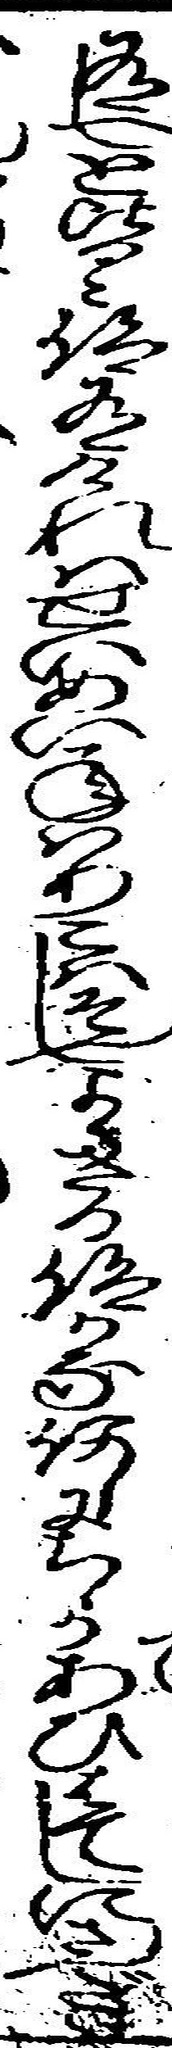有へしと皆々仰有けれはせいめい承はりこはそんしよらさる仰かな何しに父かあひはてしにさんだ
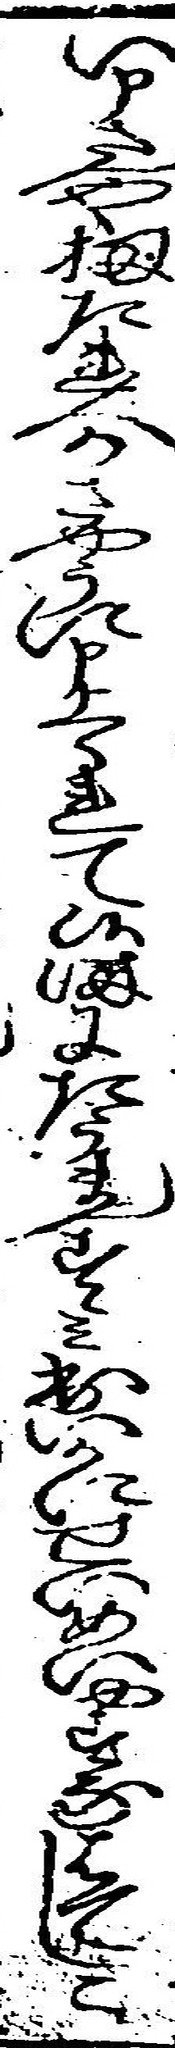い申さんや扨たれ人かさやうに申上られて候時にたうまんすゝみ出いかにせいめいやすなはてしこ
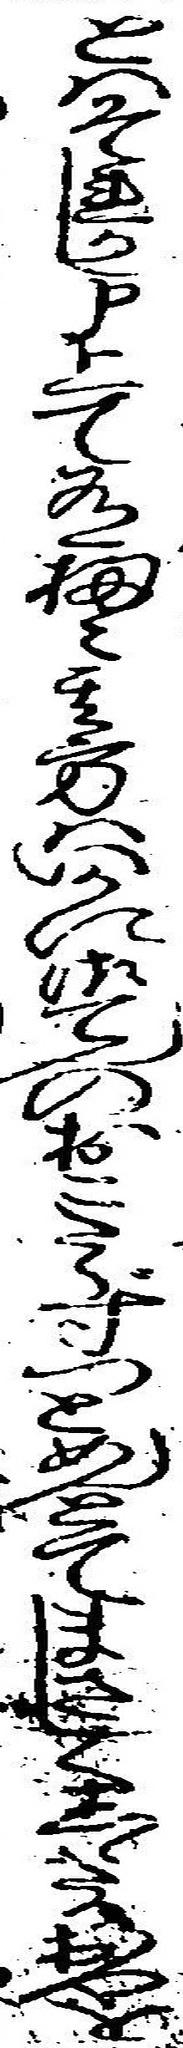とはそれかし申上て有扨々其方はいかに御てんのおこたらずつとめんとてまさしくしゝたるおやを
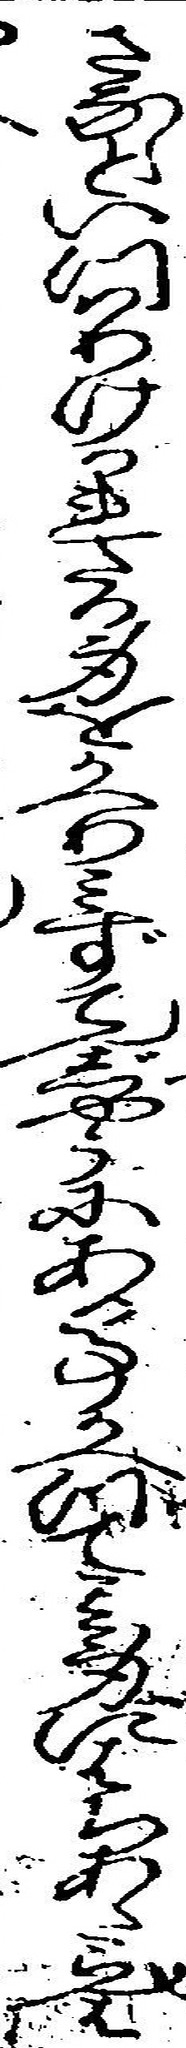さなしといつわりけかれたる身をかへりみずてんじやうにある事かへつて其身にはちあたらんは
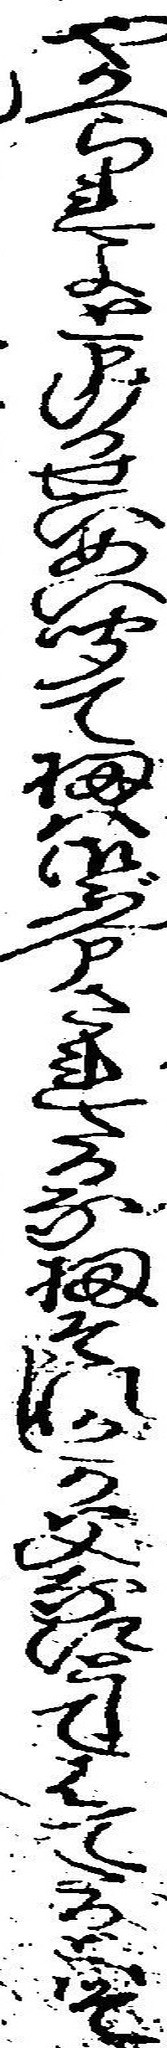やかへられよと申けるせいめい聞て扨は御ぶん申されたるな扨それかしか父なにとしてはてたるとはそ
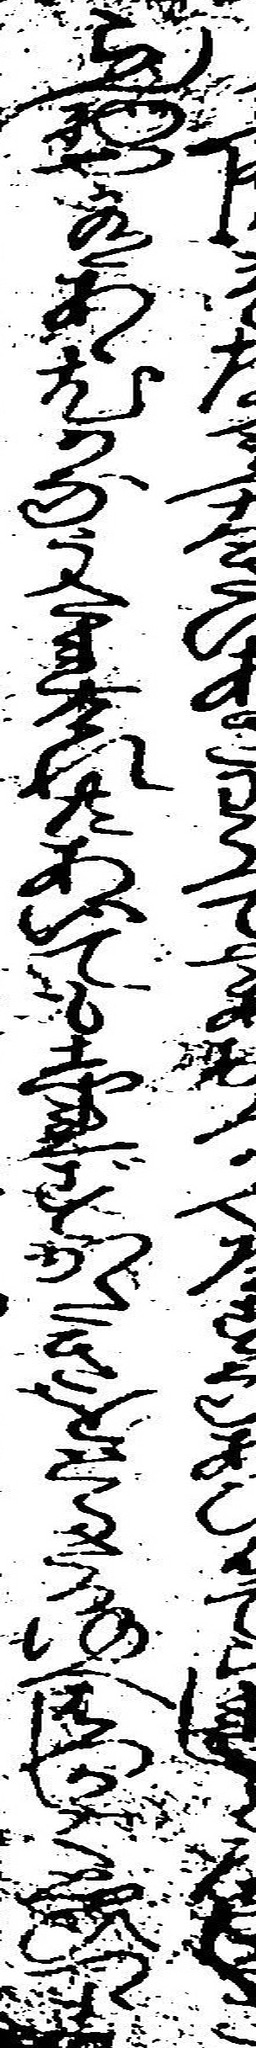らん物や有あゝ尤かなうたれけれ共あいてもしれずかたきをとらさるゆへはつかしく思ひつゝ
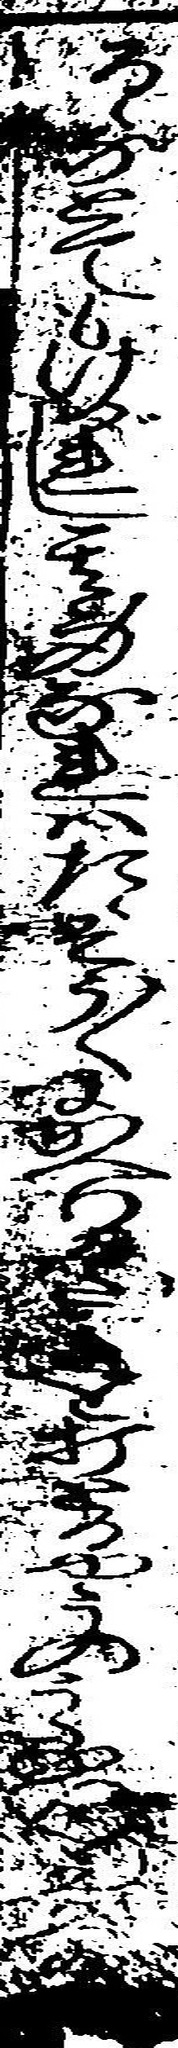るゝなとてもけがれし其身なれはたゝそう〳〵にかへりたを打とるやうのうらないをかんかへ給

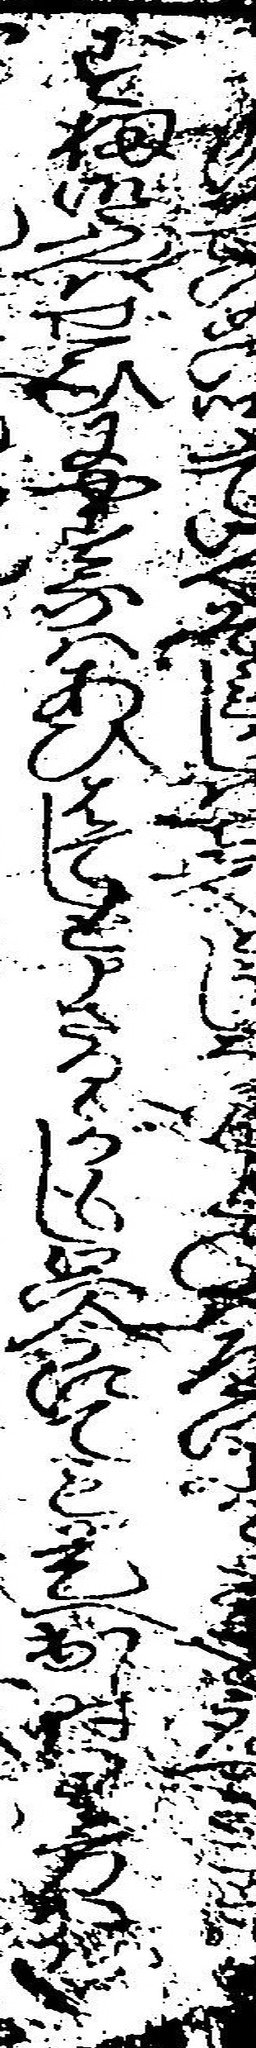ず扨御ふんはぜひにやすなはあひはてしと申さるがもし只今にても是へおし付其方は
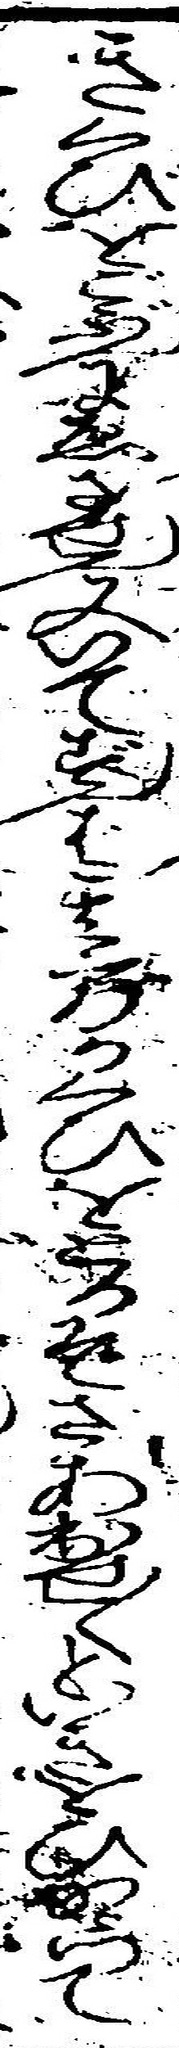きくびをごぶんにゑさせん又いてずんば其方かくびをとるぞさあ出せ〳〵といきをひかゝつて
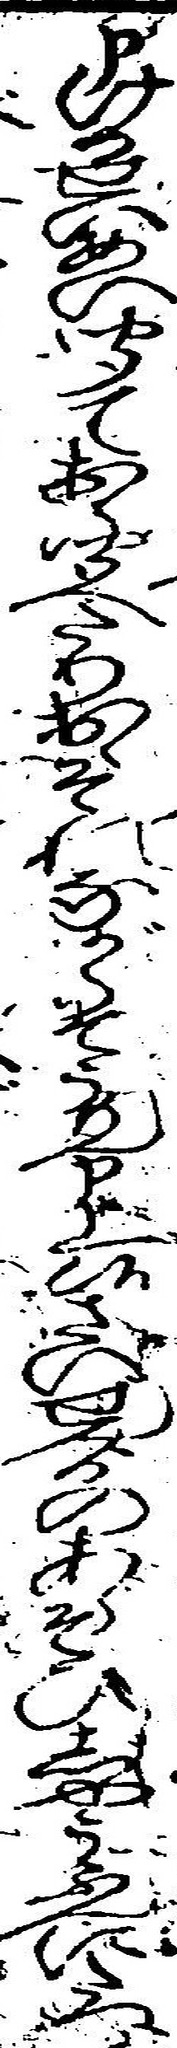申けるせいめい聞ておゝ聞へたりおゝそれながらそうもん申上候さいぜんゟのあらそひじやうぶんにた
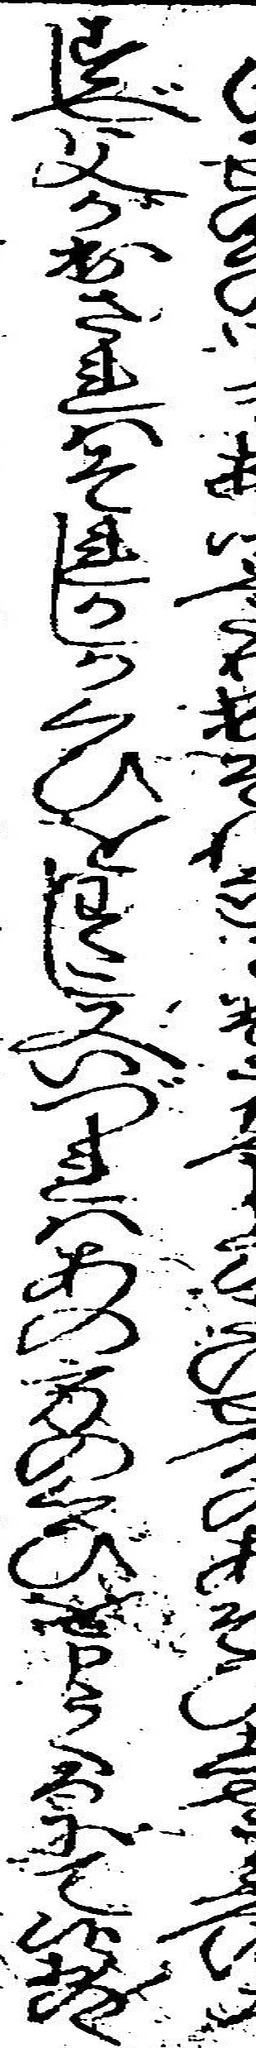すべし父が出されはそれかしかくびをわたし又いづれはあの方のくびを申うくるにて候おの〳〵
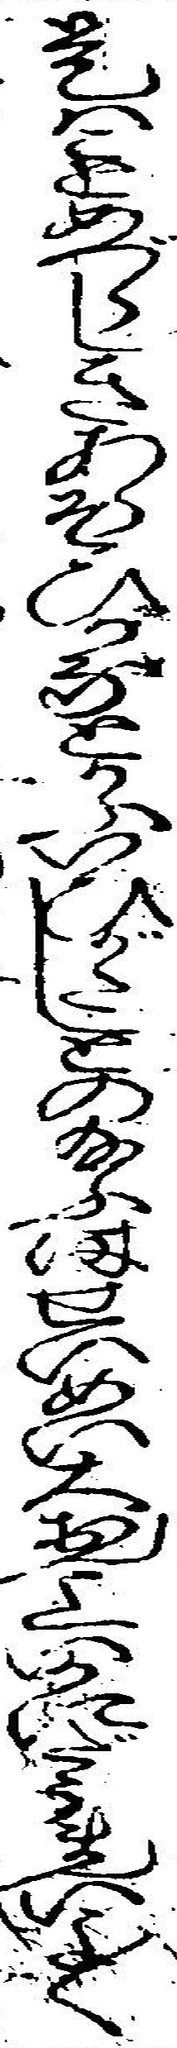是はことめづらしきあらそひかなとかふいひがたしとの給ふ時せいめい大おん上いかにだうまんいよ〳〵
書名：[しのだづまつりぎつね付あべの清明出生]
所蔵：東京大学総合図書館 General Library in the University of Tokyo, JAPAN
